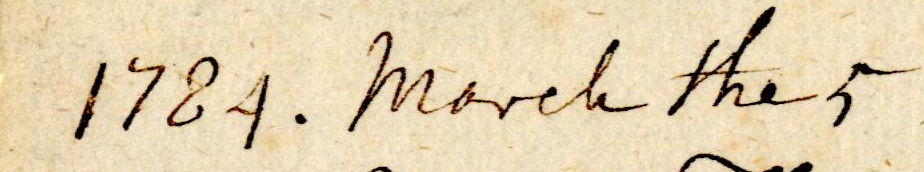1784. March the 5
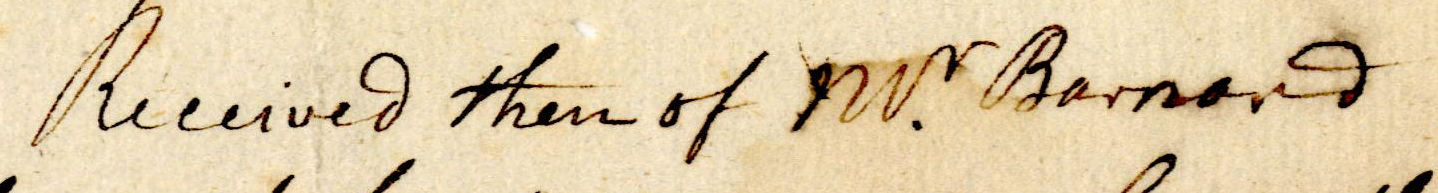Received then of M^r. Barnard
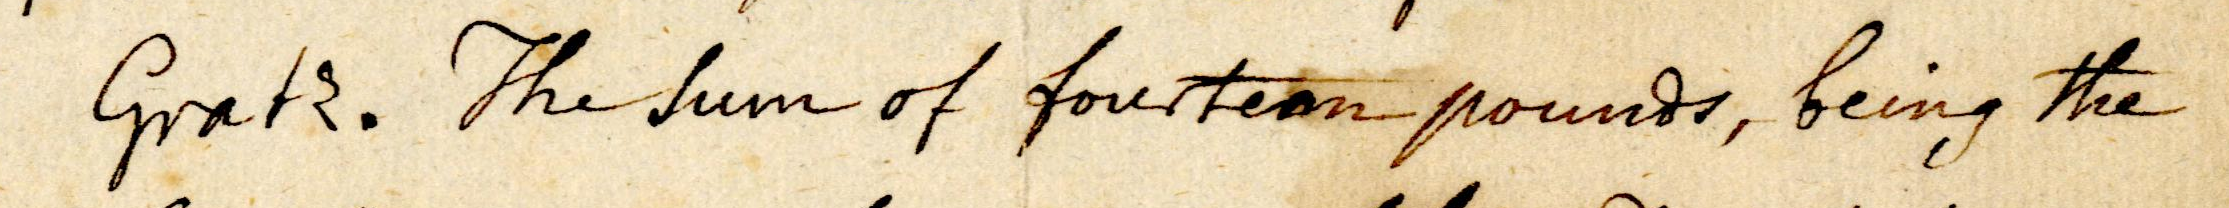Gratz. The sum of fourteen pounds, being the
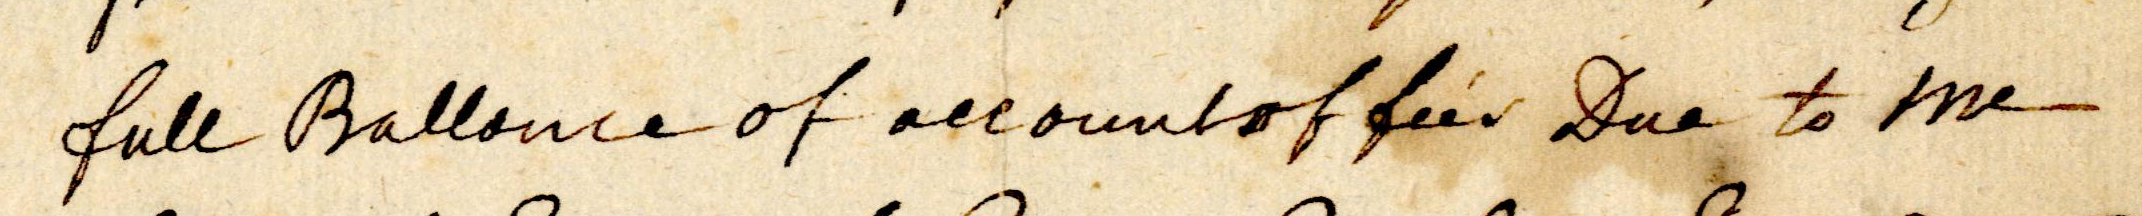full Ballance of account of fur Due to me
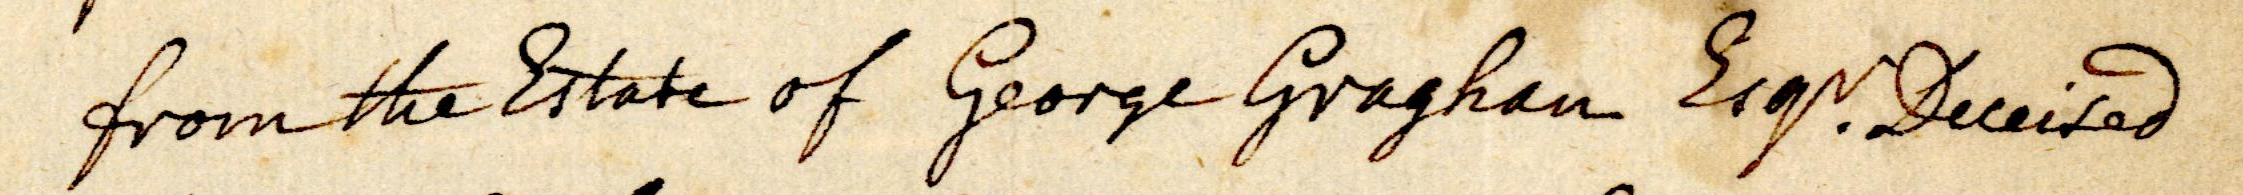fom the Estate of George Groghan Esq^r. Deceised
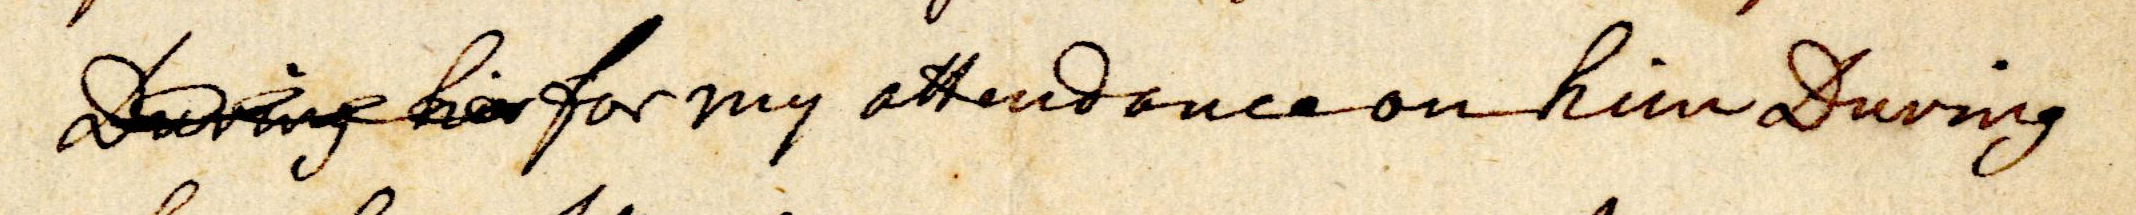[During his] for my attendance on him During
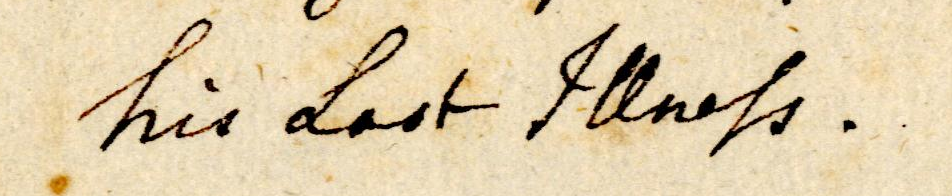his last Illness.
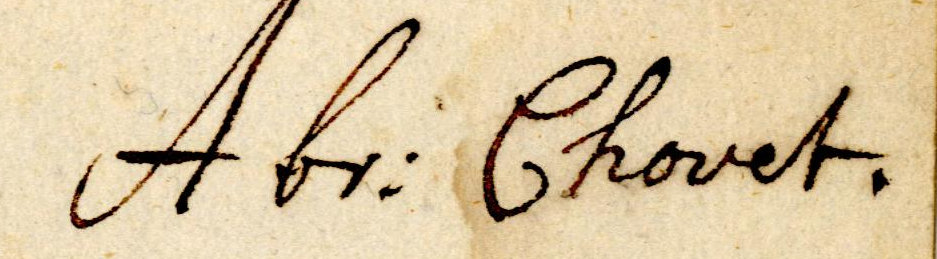Abr: Chovet
